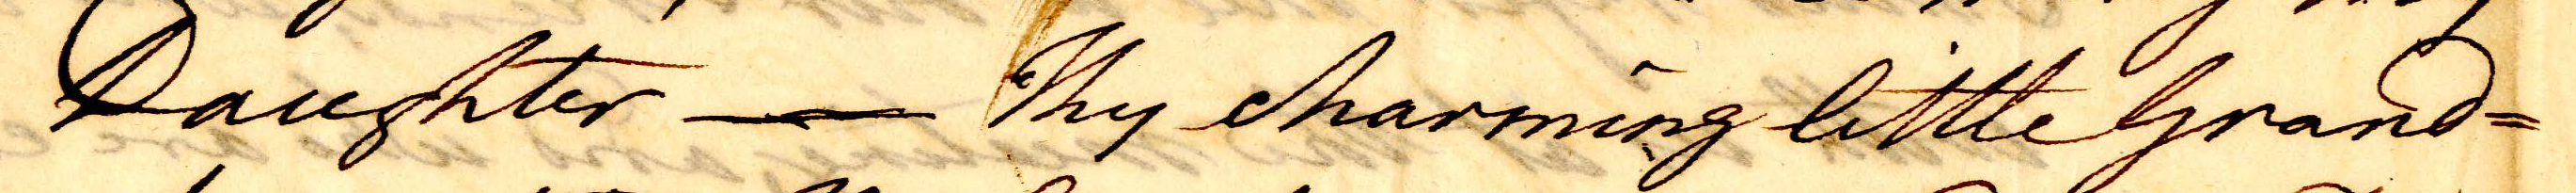Daughter- Thy charming little Grand-
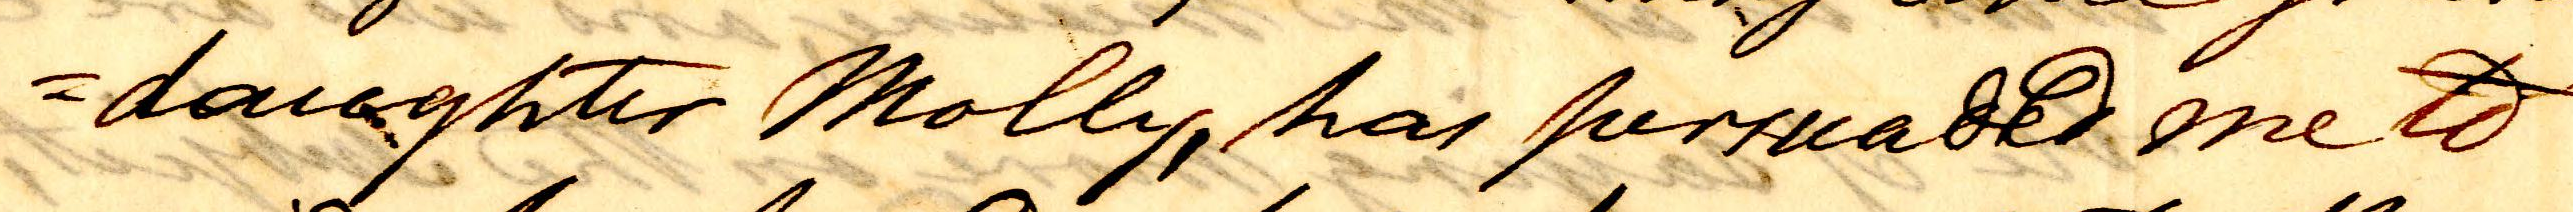-daughter Molly, has persuaded me to
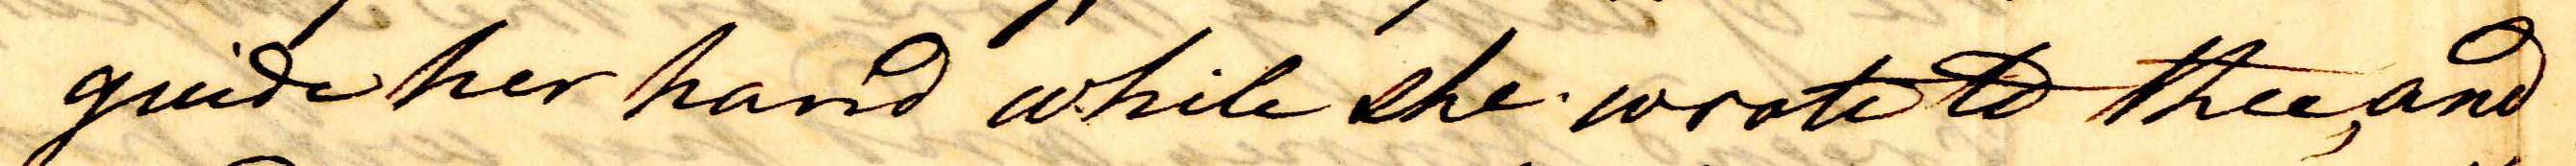guide her hand while she wrote to thee, and
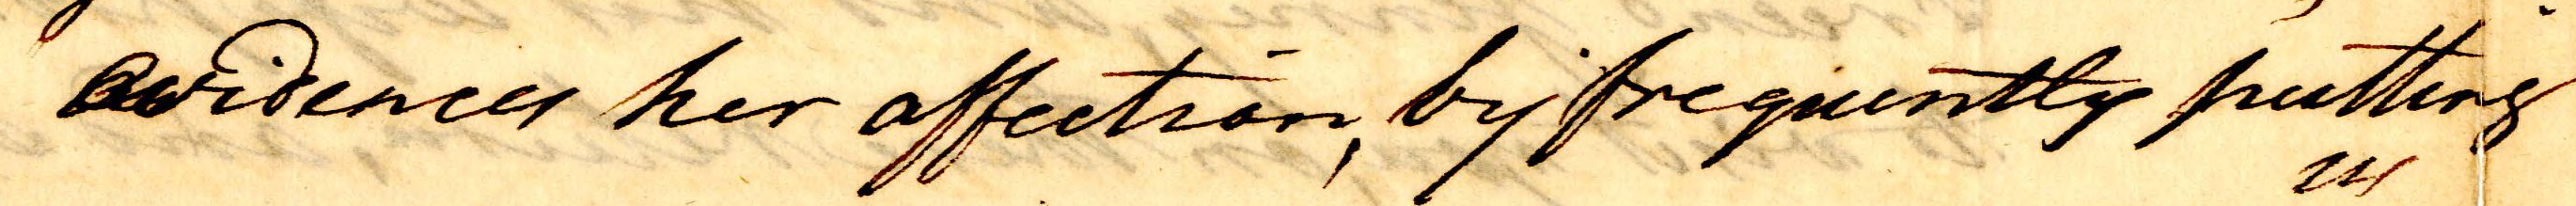evidences her affection, by frequently putting
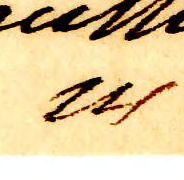us
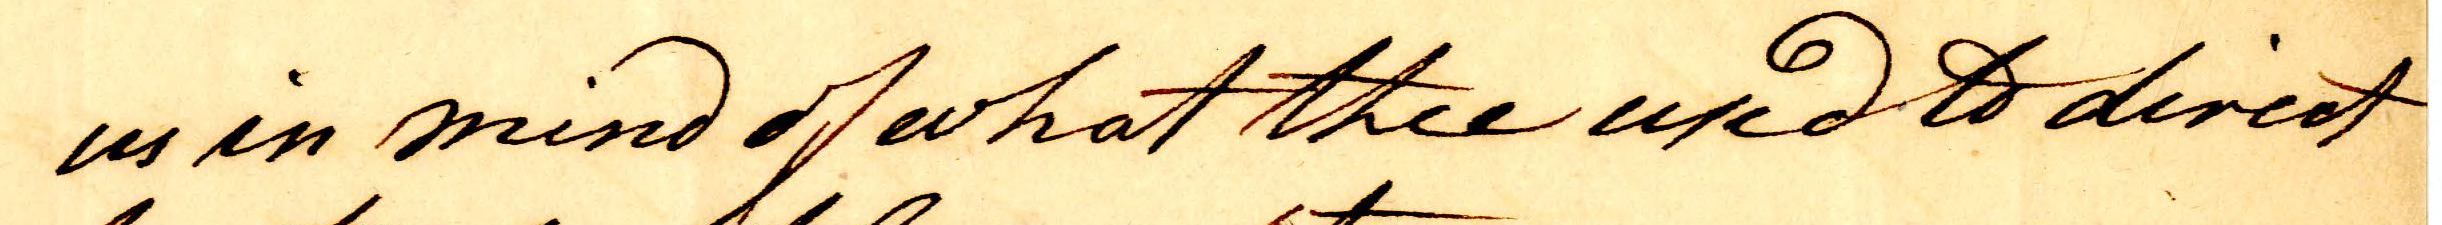us in mind of what thee used to direct
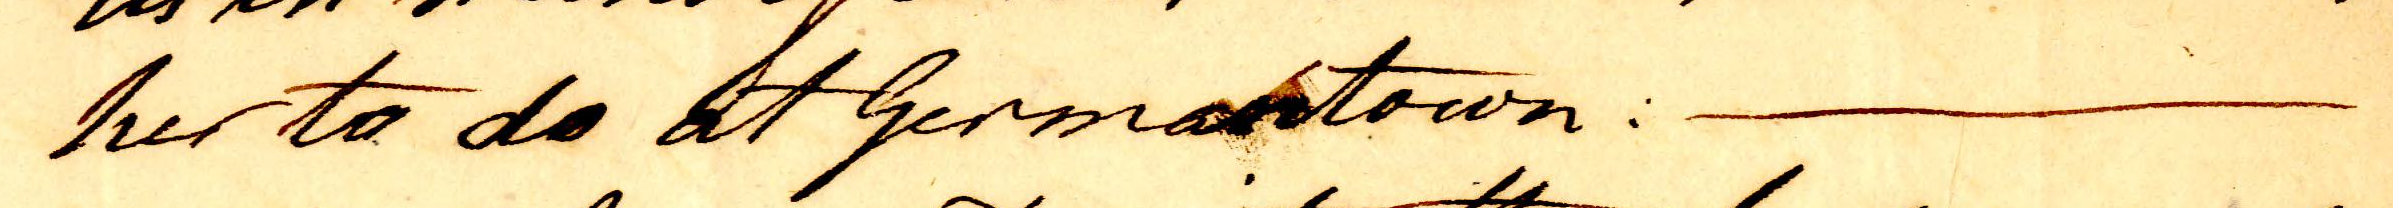her to do at Germantown:-
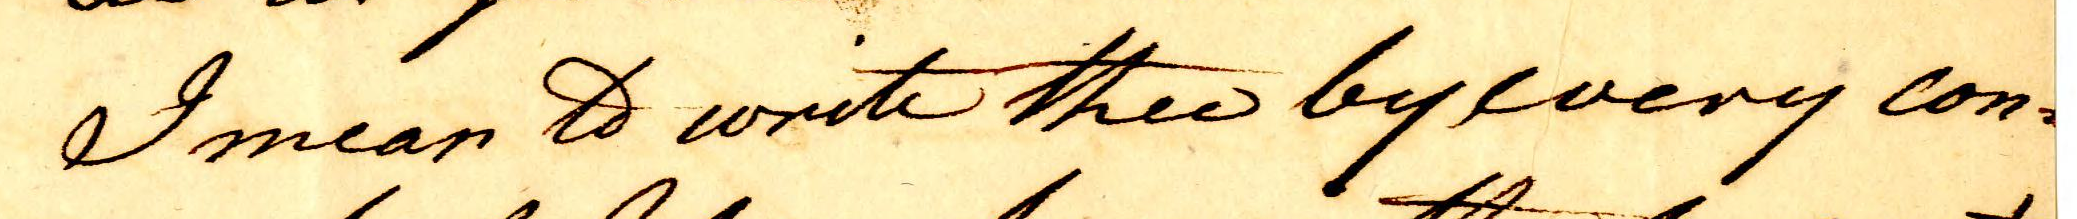I mean to write thee by every con-
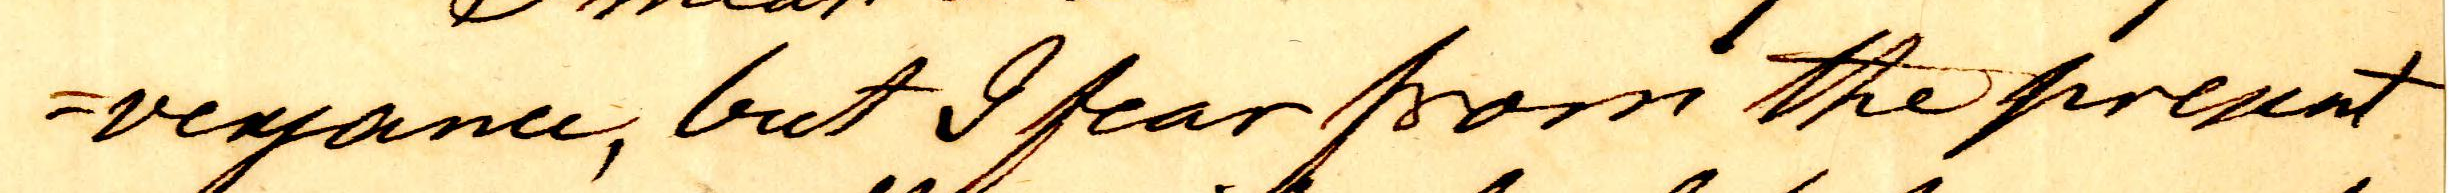-veyance, but I fear from the present
